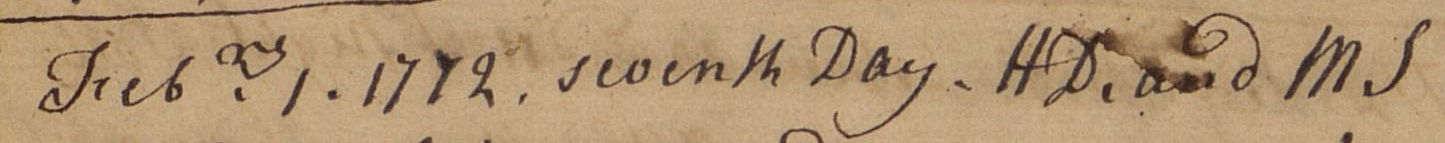Feb^ry. 1. 1772. seventh Day. HD. and MS
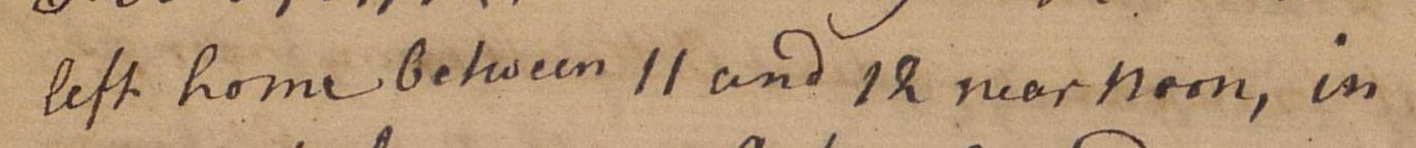left home between 11 and 12 near noon, in'
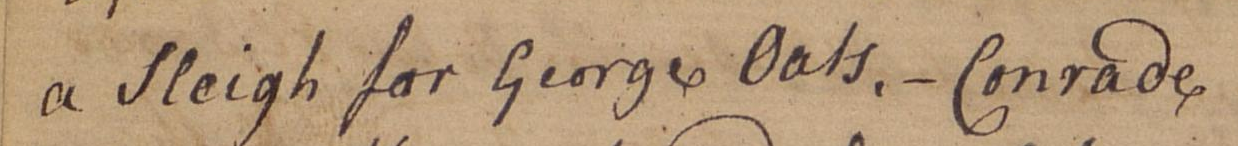a Sleigh for George Oats.- Conrade
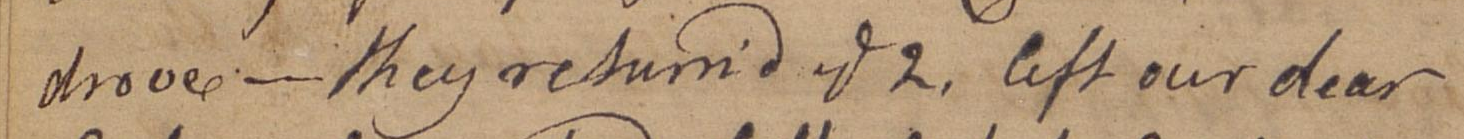drove- they return'd y^e 2, left our dear
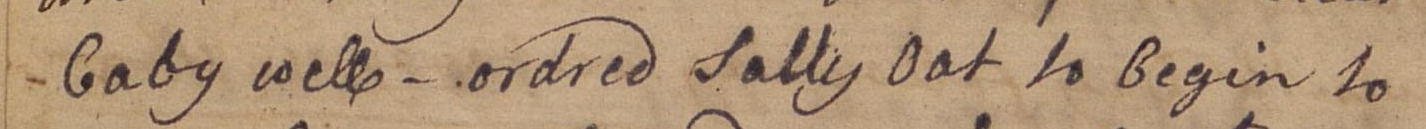baby well- ordred Sally Oat to begin to
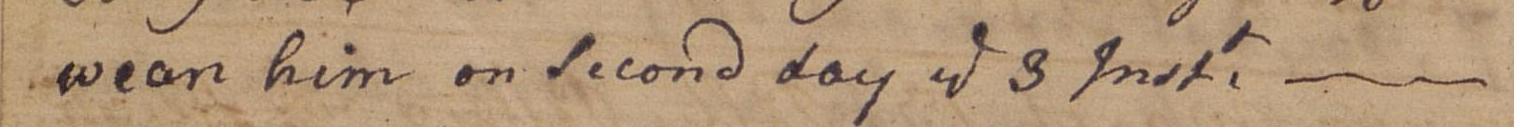wean him on second day y^e 3 Inst^t?.-
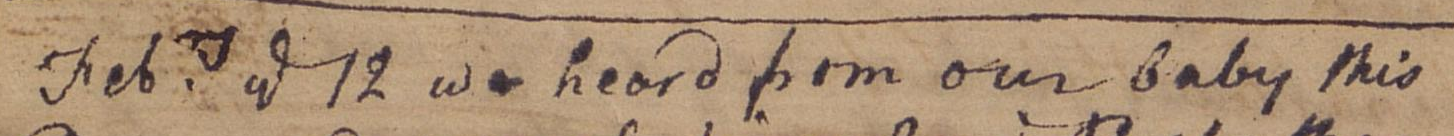Feb^ry. y^e 12 we heard from our baby this
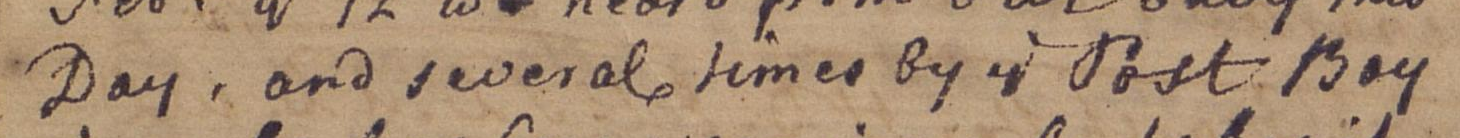Day, and several times by y^e Post Boy
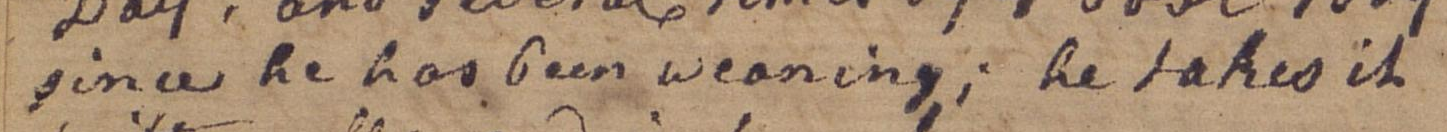since he has been weaning; he takes it
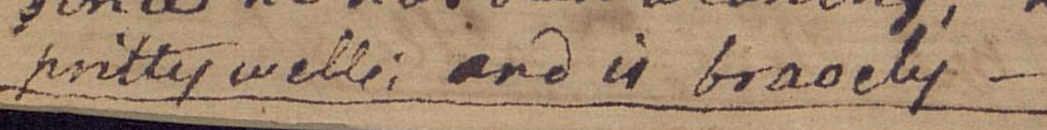pritty well; and is bravely-
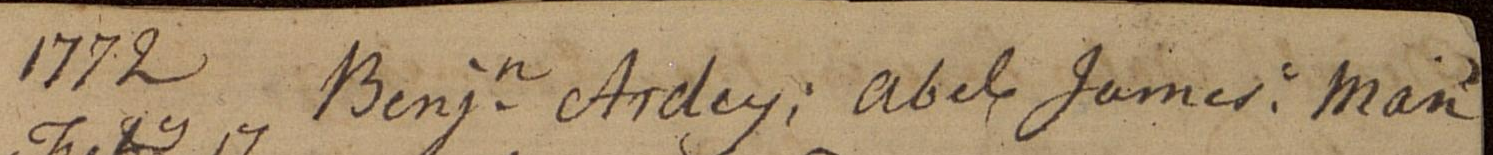1772 Benj^n. Ardey; Abel James^s man
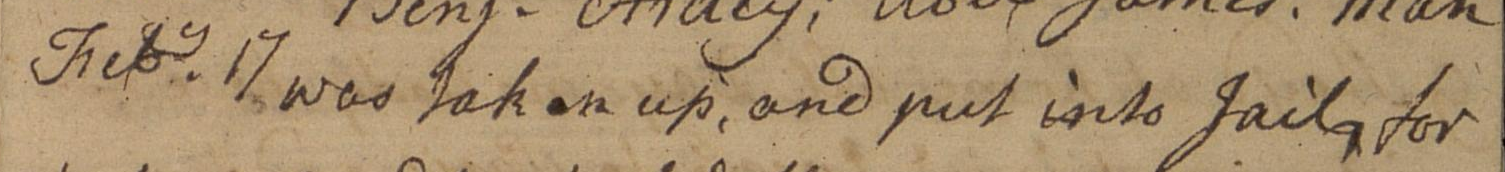Feb^y. 17 was taken up, and put into Jail, for
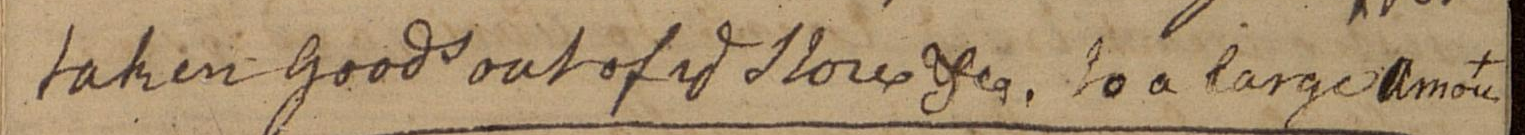taken goods out of y^e Store &c, to a large Amou^t
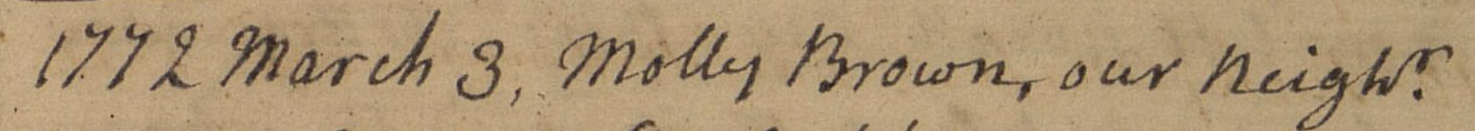1772 March 3, Molly Brown, our Neigh^r.
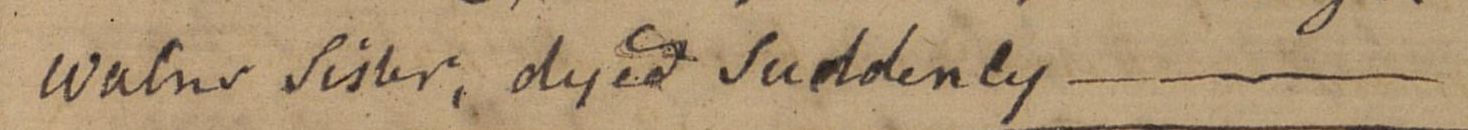Walns Sister, dyed Suddenly-
